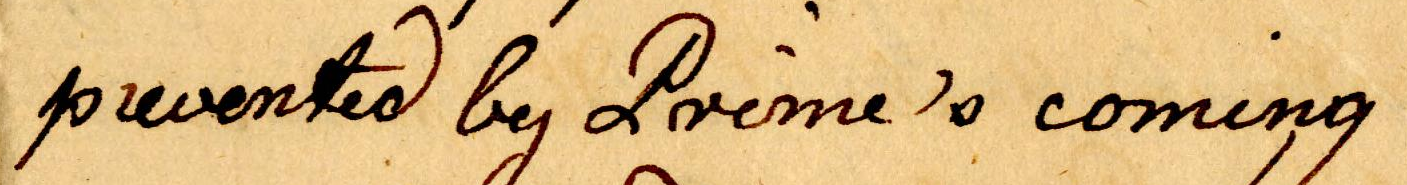prevented by Prime's coming
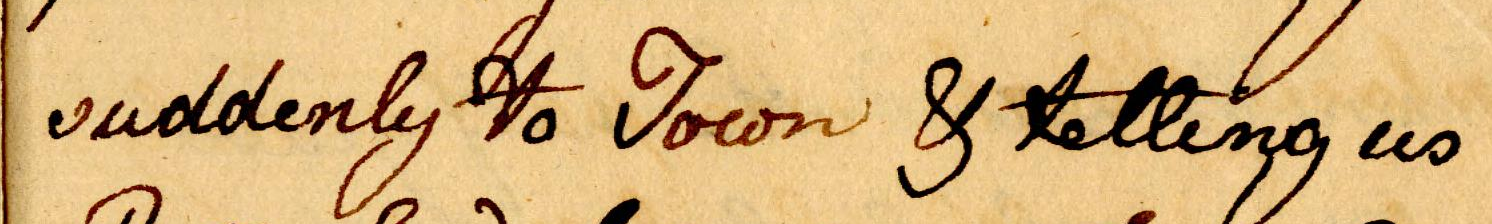suddenly to Town & telling us
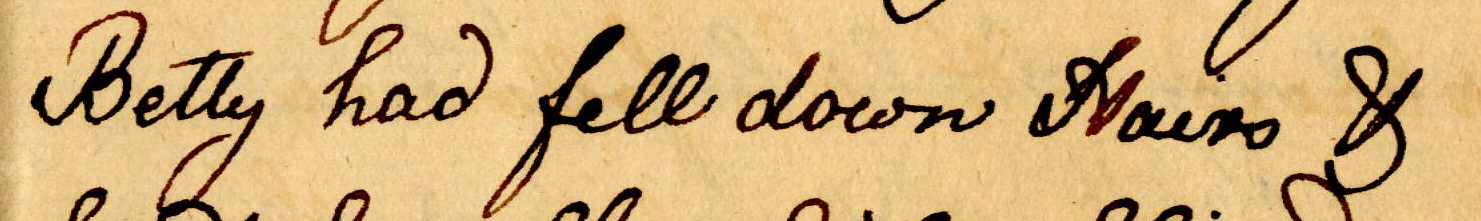Betty had fell down Stairs &
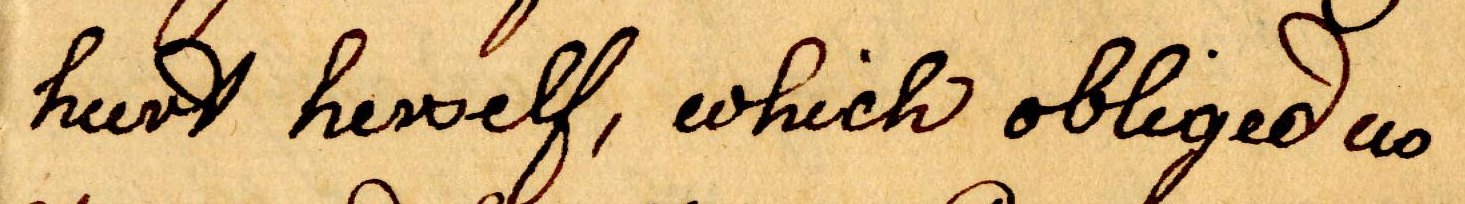hurt herself, which obliged us
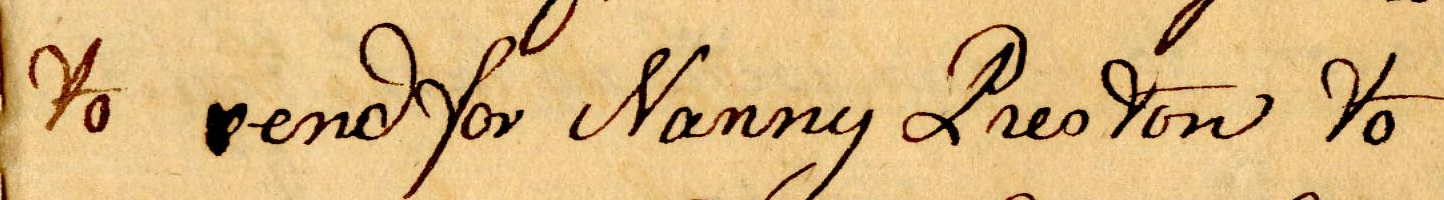to send for Nanny Preston to
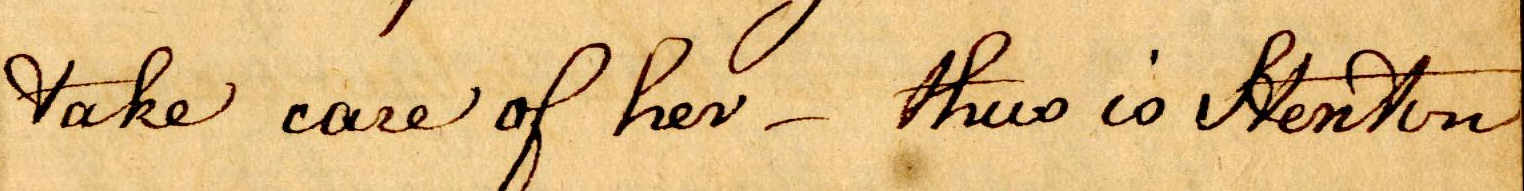take care of her- thus is Stenton
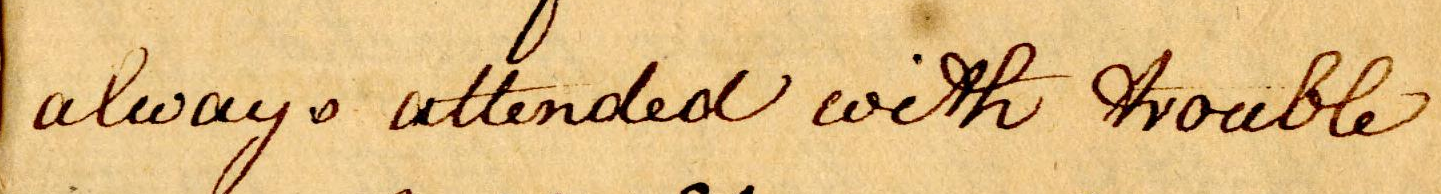always attended with trouble
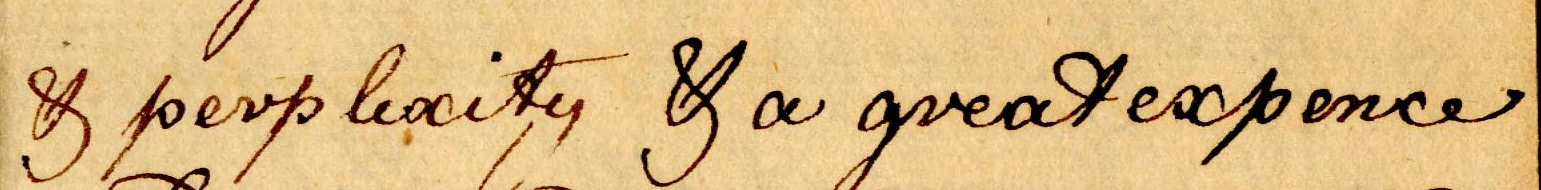& perplexity & a great expence
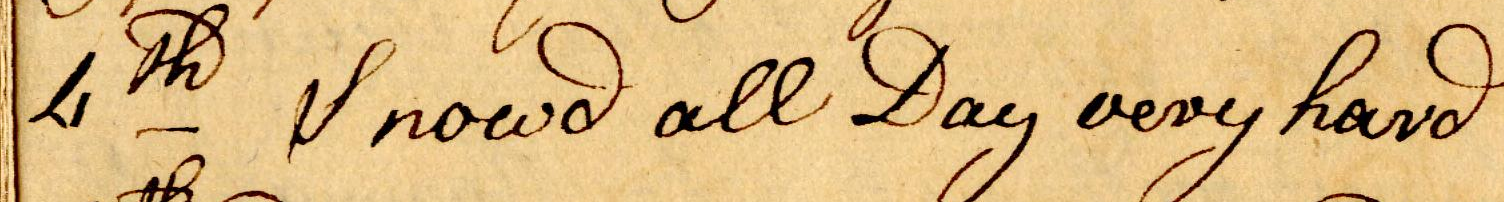4^th- Snowd all Day very hard
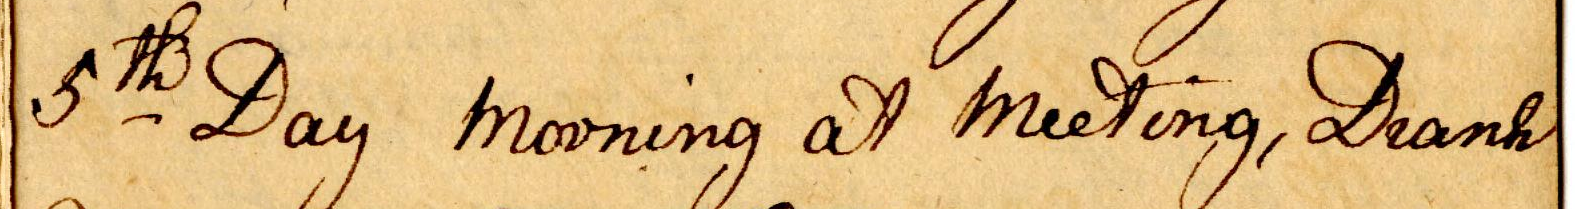5^th. Day Morning at Meeting, Drank
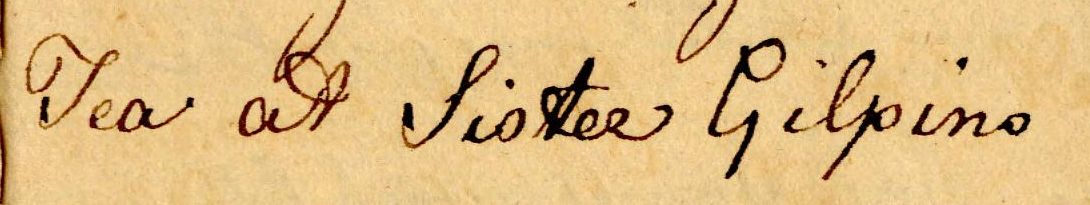Tea at Sister Gilpins
